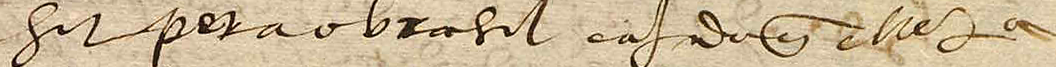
hir pera o brasil e aJnda q̄ elle ta
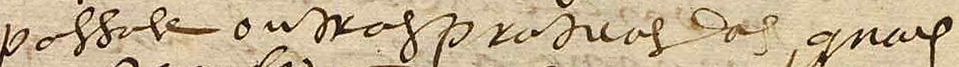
passase outras praticas das quaes
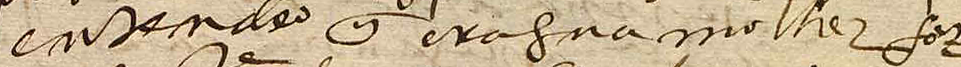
entendeo q̄ era sua molher for
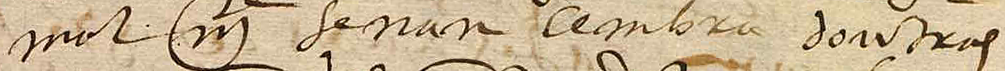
malmte se nan lembra doutras
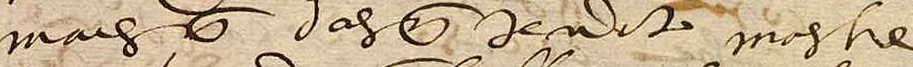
mais q̄ das q̄ ten dito mas he
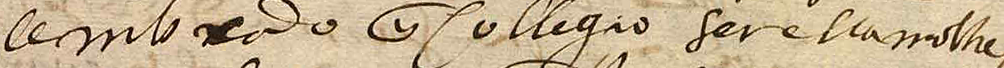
lembrado q̄ Collegio ser ella molher
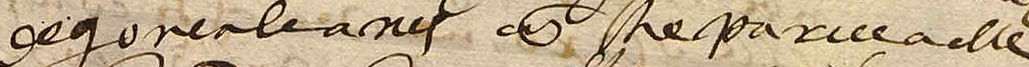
de goncaleanes o q̄ lhe parece a elle
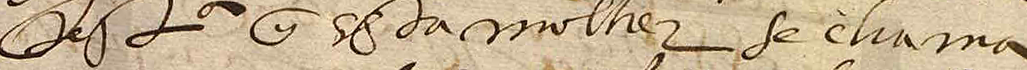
testa q̄ Esta molher se chama
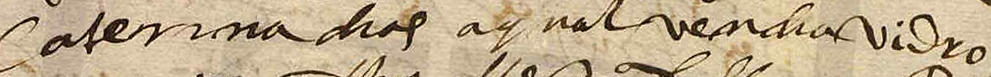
Caterina dias a quaL vendia vidro
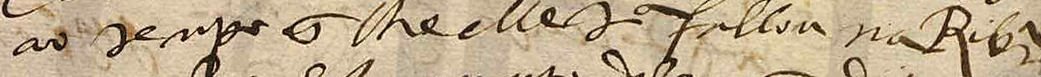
ao tempo q̄ lhe elle ta fallou na Ribra
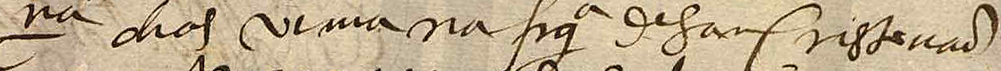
Cna dias viuia na frga de sam Cristouaõ
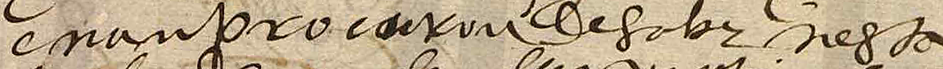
e nan procurou de saber nesta
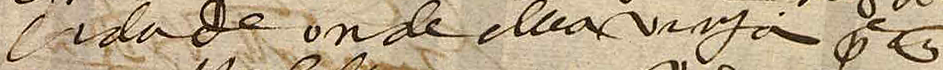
Cidade onde elle a viu Ja p̄o o q̄
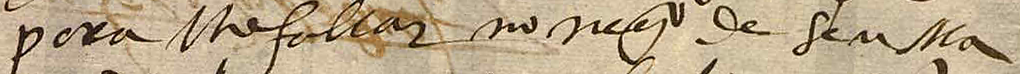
pera lhe fallar no nego de seu Ma
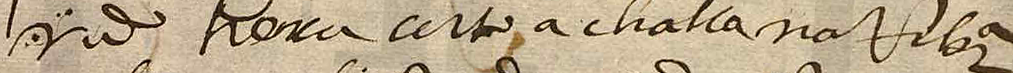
rido hera certo achalla na Ribra
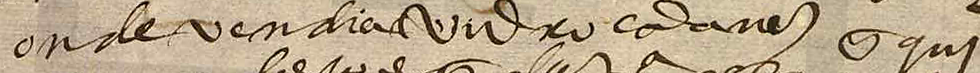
onde vendia vidro cada vez q̄ quj
